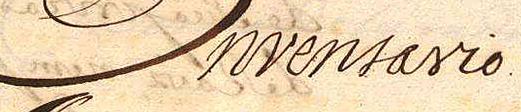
Inventario.
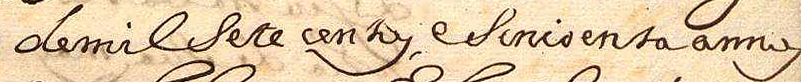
de mil Setecentos, e Sincoenta annos
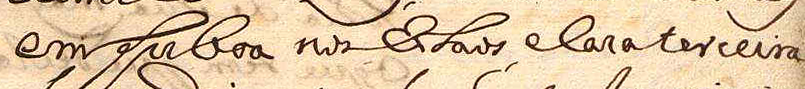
em Lisboa nos Estaos e Caza terceira
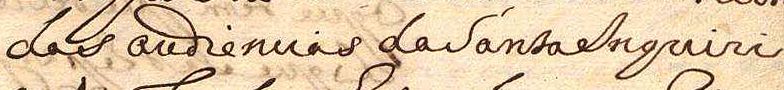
das audiencias da Santa Inquizi
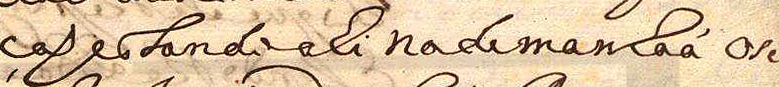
çaõ estando ahi na de manhaã o se
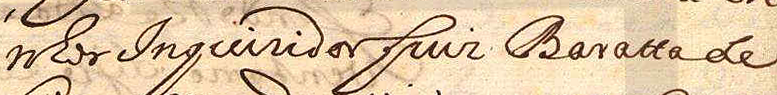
nhor Inquizidor Luiz Baratta de
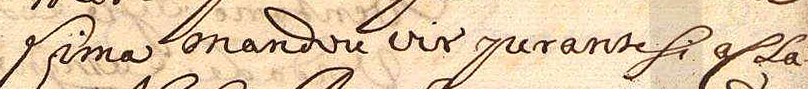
Lima mandou vir perante si a CLa
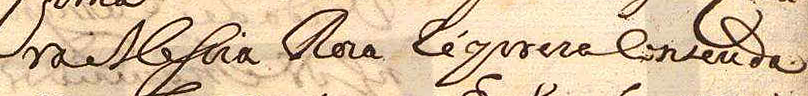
ra Messia Roza Ré preza Conteuda
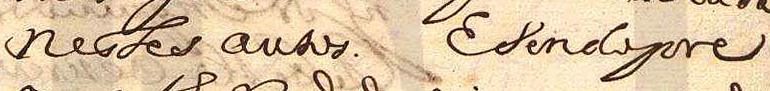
nestes autos. E Sendo pre
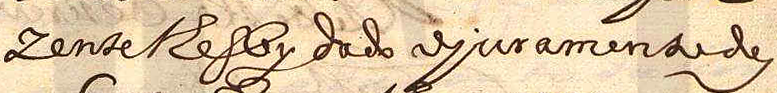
zente lhe foy dado o juramento dos
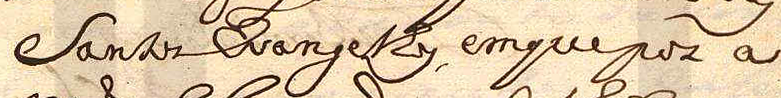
Santos Evangelhos, em que poz a
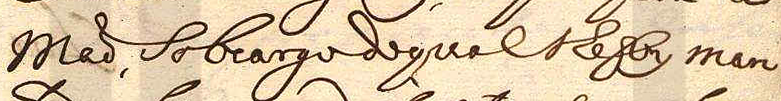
maõ, sob cargo do qual lhe foy man
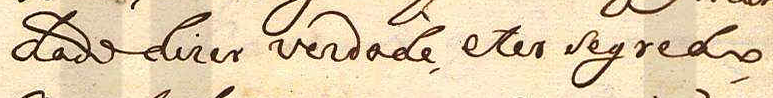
dado dizer verdade, e ter segredo,
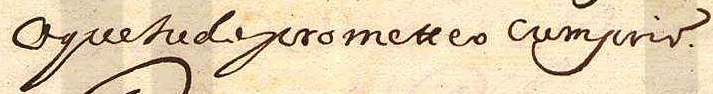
O que tudo prometteo cumprir.
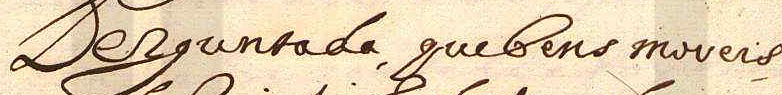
Perguntada, que bens moveis,
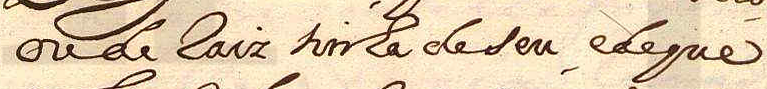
ou de Raiz tinha de seu, e de que
